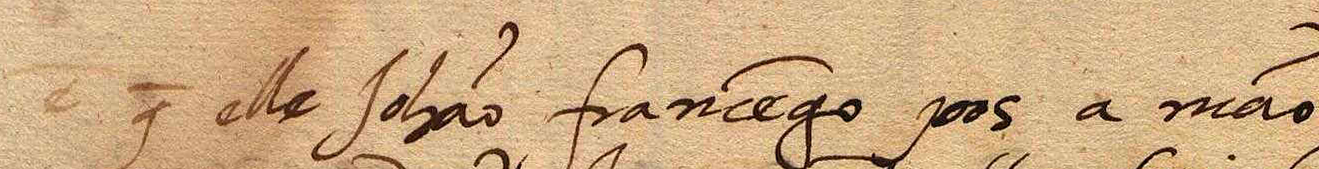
ē q̄ elle Johão framēgo pos a mão
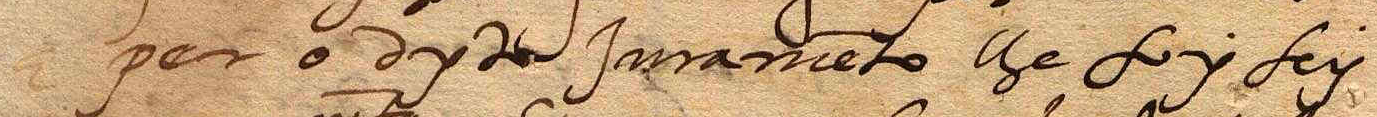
E per o dyto Juramēto lhe foy fey
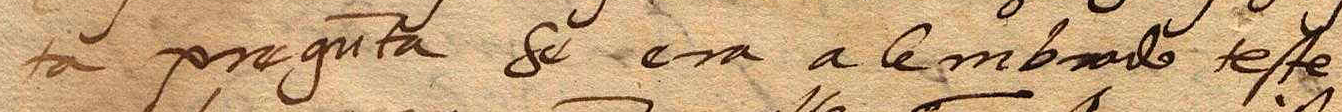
ta pregūta se era alembrado teste
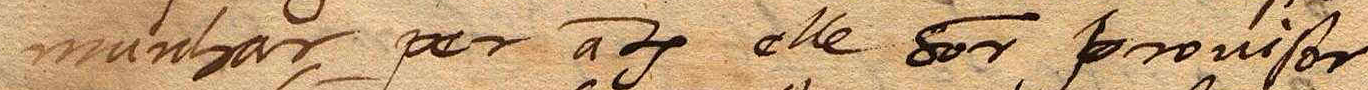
munhar perātꝭ elle sōr prouisor
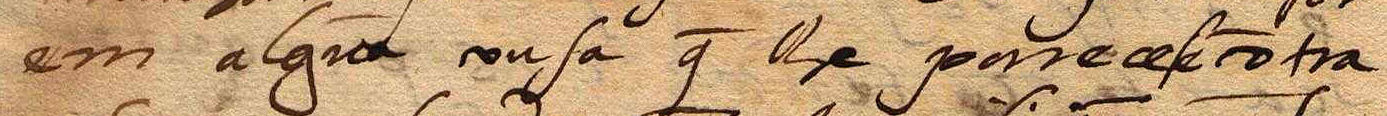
em alguā cousa q̄ lhe parecese cōtra
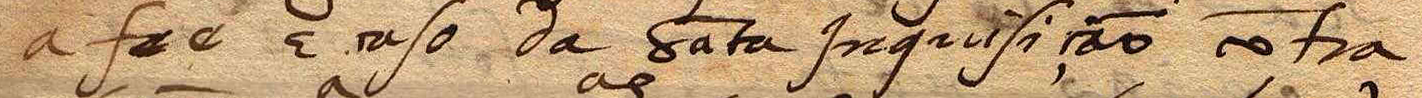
a fee E caso da sāta Jnquisição cōtra
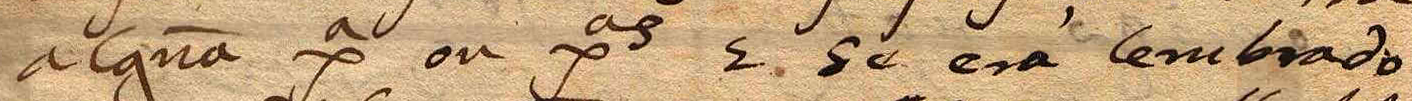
algūa pa ou pas E se era lembrado
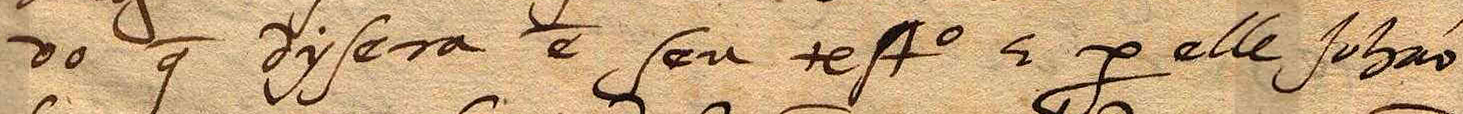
do q̄ dysera ē seu testo E ꝑ elle Johaõ
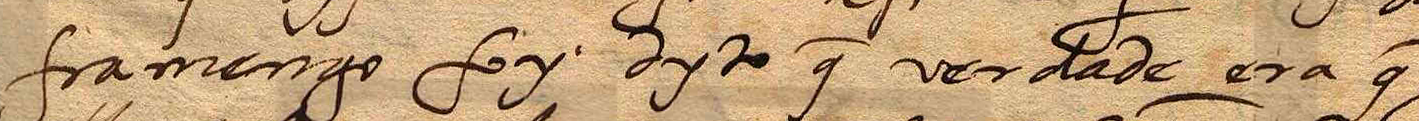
framengo foy dyto q̄ verdade era q̄
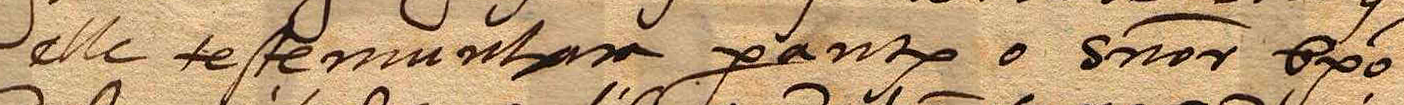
elle testemunhara ꝑantꝭ o sn̄or bpō
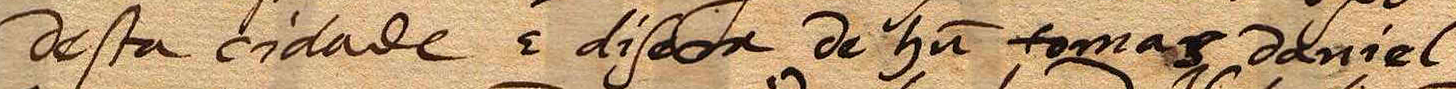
desta cidade E disera de hū tomas daniel
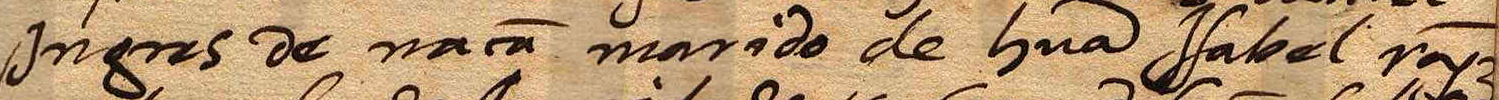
Jngres de naçā marido de huā Jsabel rōyz
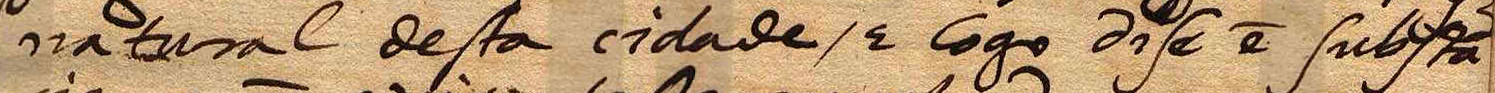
natural desta cidade / E logo dise ē substā
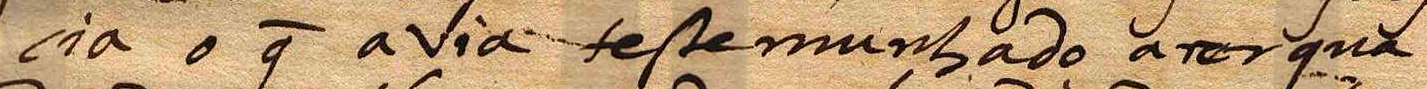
cia o q̄ avia testemunhado acerqua
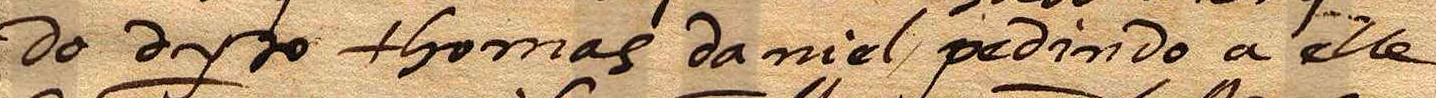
do dyto thomas daniel pedindo a elle
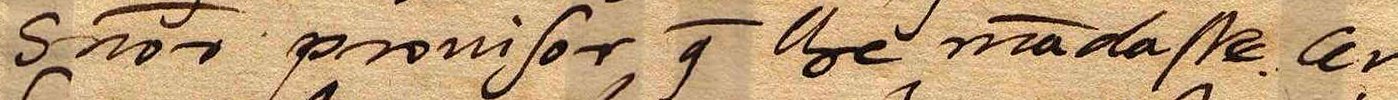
Sn̄or prouisor q̄ lhe mādasse ler
